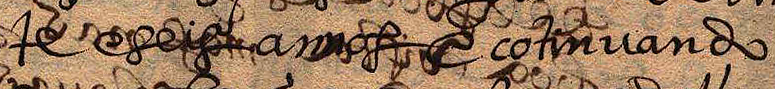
te e seis annos e cōtinuando
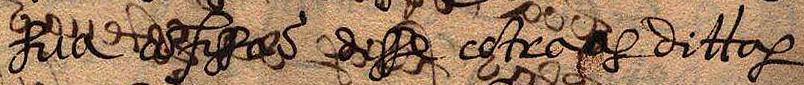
sua cōfissaõ disse cōtra as dittas
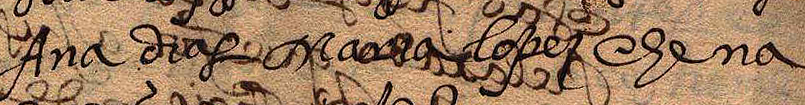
Ana dias Maria lopez e he na
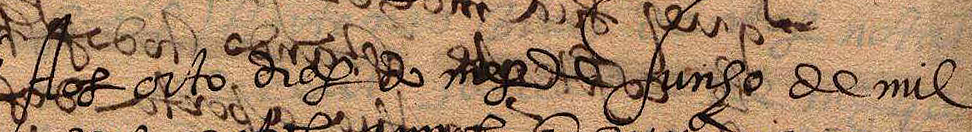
Aos oito dias do mes de Junho de mil
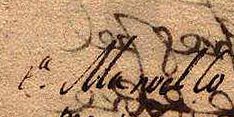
ta Manuel lo
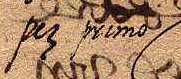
pez primo
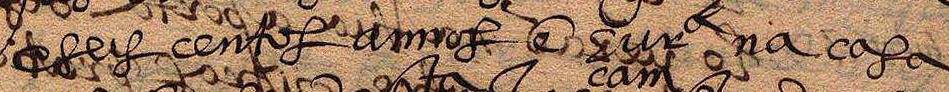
e seiscentos annos ē Eura na casa
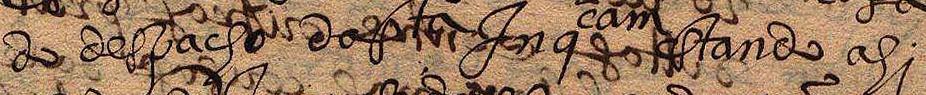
do despacho da sta Jnqçam estando ahj
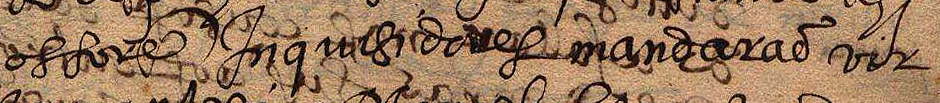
os sores̄ Jnquisidores mandaraõ vir
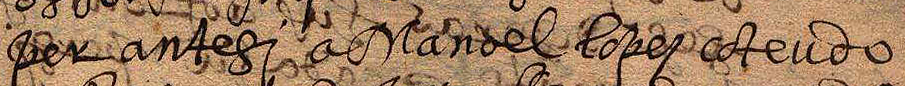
perante sj a Manoel lopez cōteudo
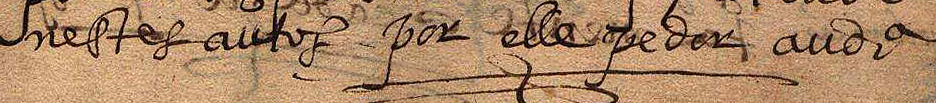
nestes autos por elle peder audia
